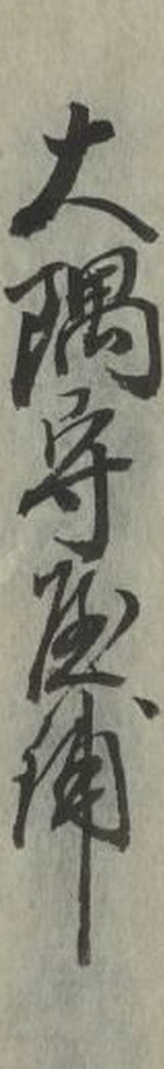大隅守屋鋪
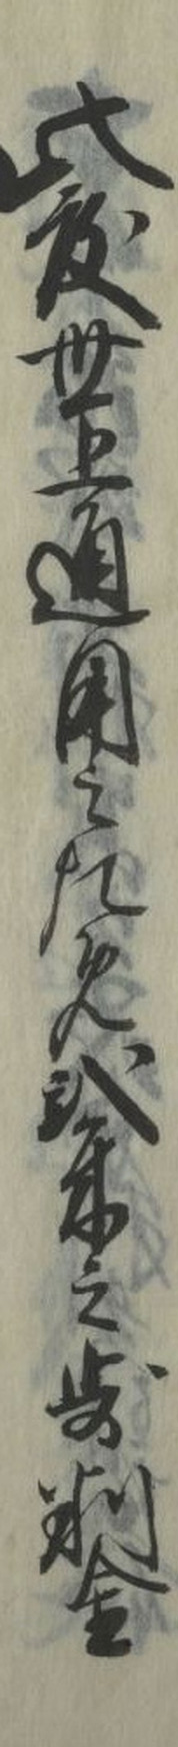此度世上通用之ため弐朱之歩判金
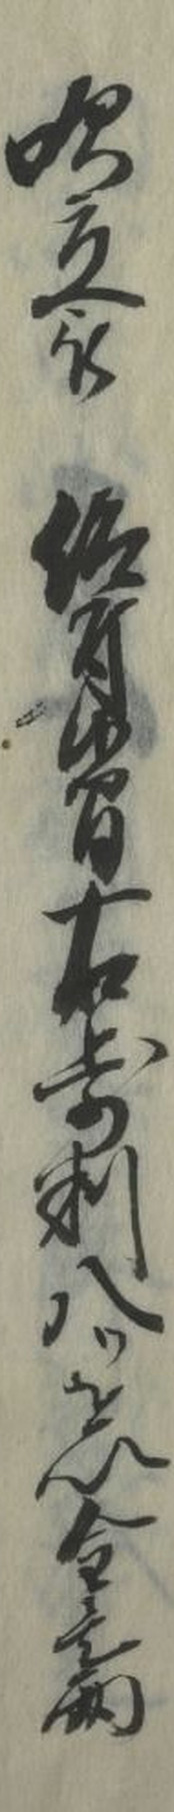吹立被仰付候間右歩判八ツを以金壱両
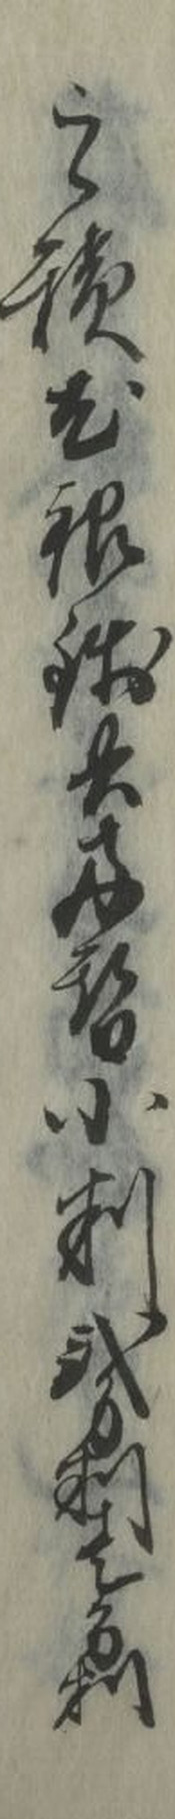之積尤銀銭共為替小判弐分判壱分判
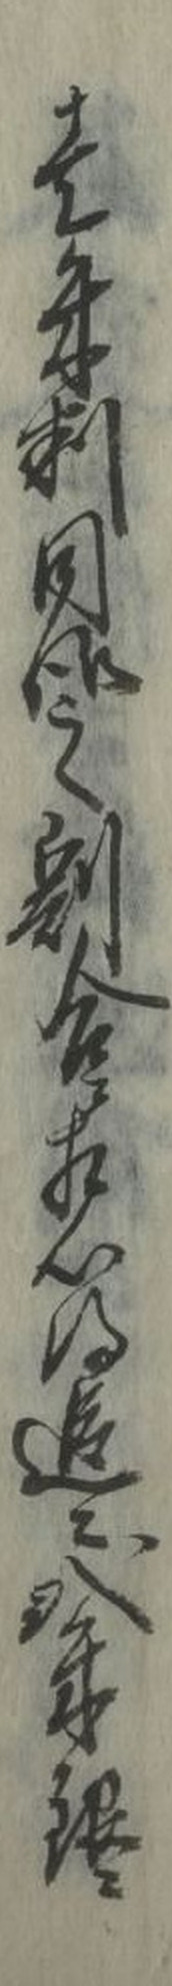壱朱判同様之割合に相心得追々弐朱銀に

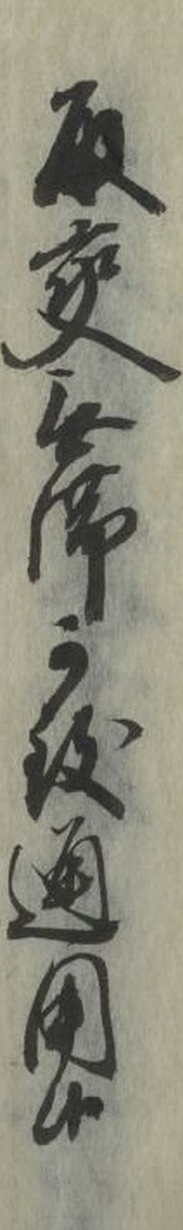取変無滞可致通用候
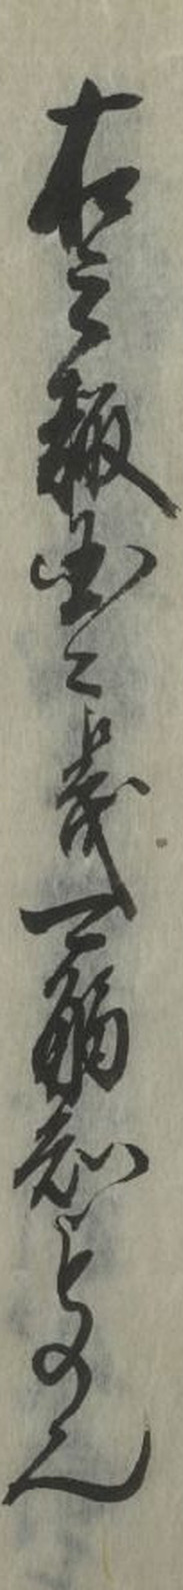右之趣国々えも可触知もの也
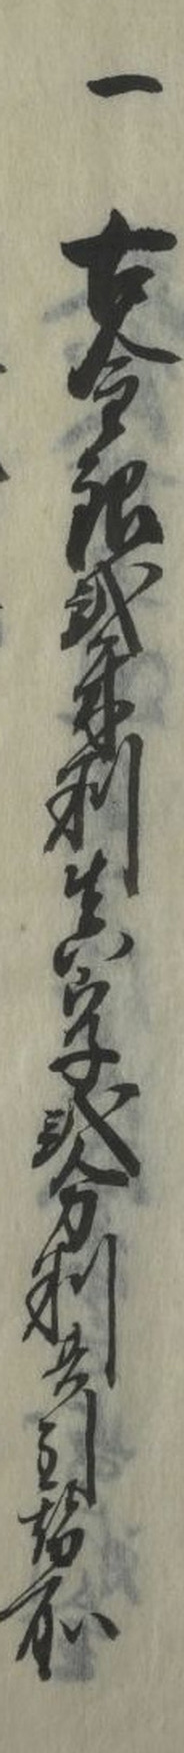一右金銀弐朱判真字弐分判共引替所
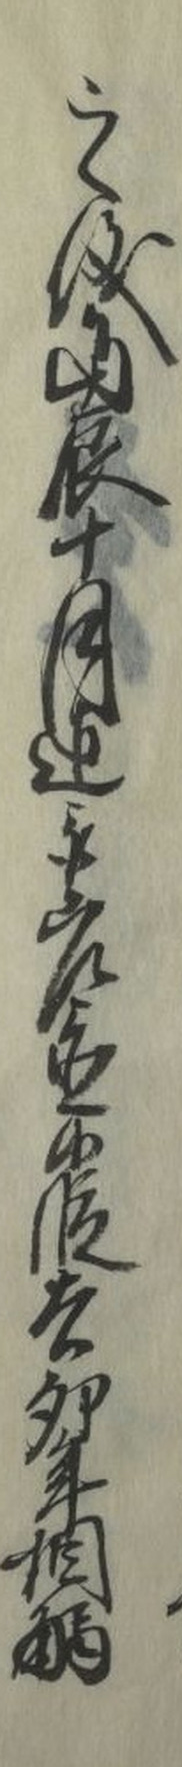之儀当辰十月迄被差置候段去卯年相触
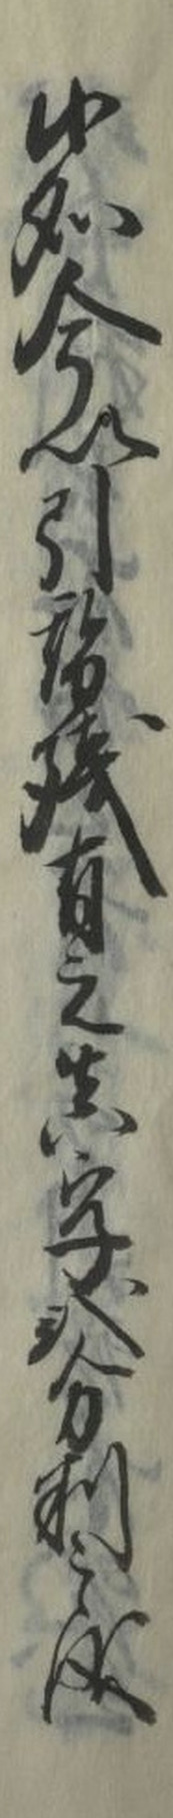候処今以引替残有之真字弐分判之儀
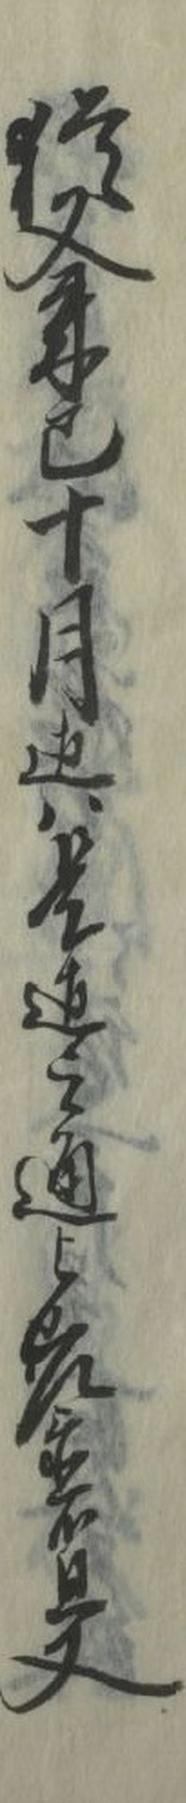猶又来巳十月迄は是迄之通被差置候且又
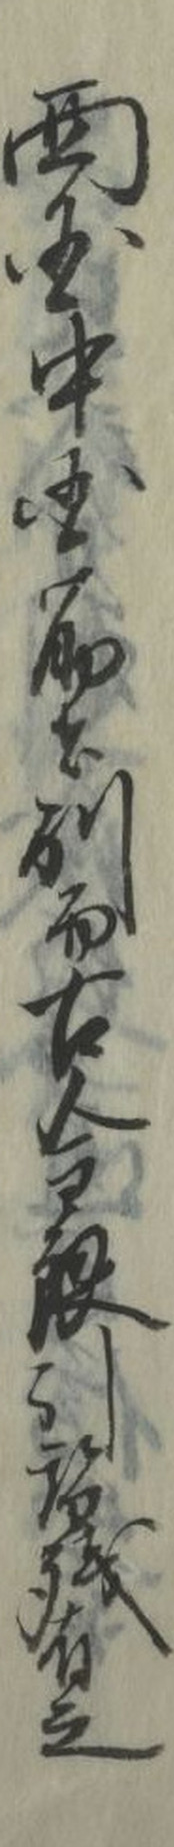西国中国筋は別而右金銀引替残有之
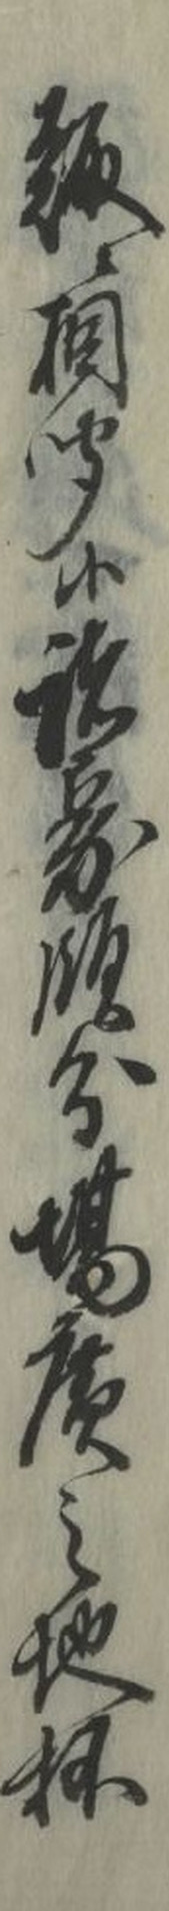趣に相聞候諸家領分場広之地抔
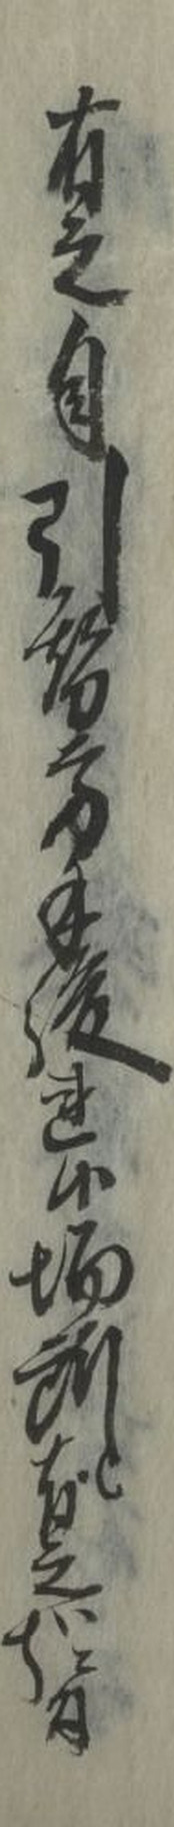有之自引替方手後れ候場所も有之哉に付

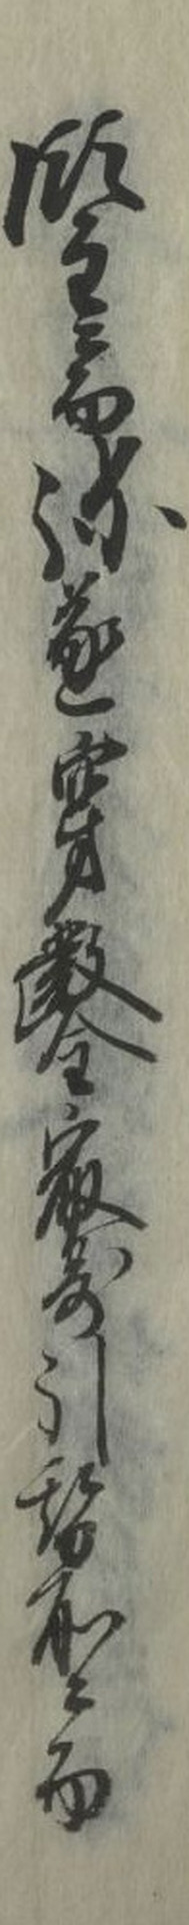領主に而弥遂穿鑿最寄引替所に而
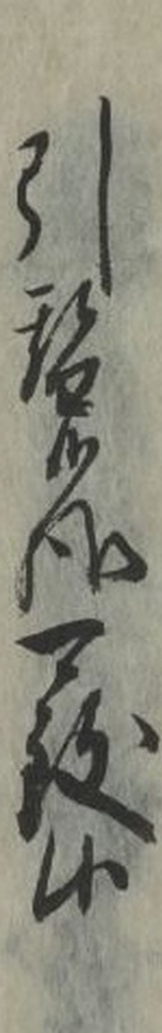引替候様可致候
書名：天保三壬辰年・琉球人参府・弐朱吹立御触写
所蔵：University of the Ryukyus Library
